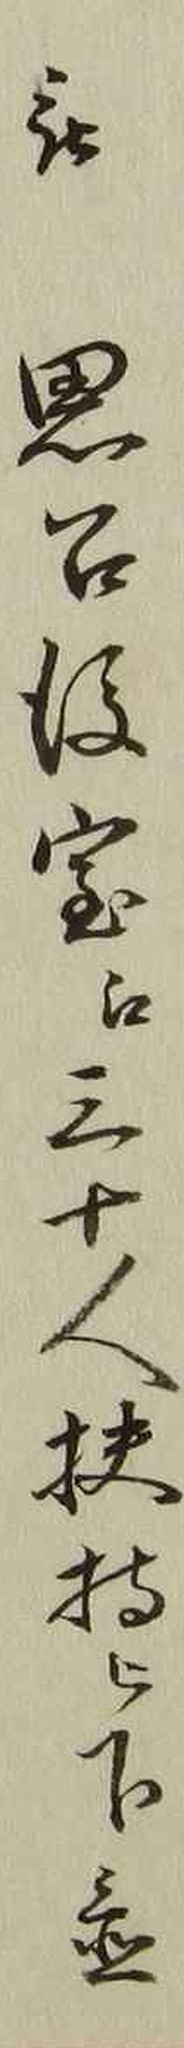被思召後室江三十人扶持被下置
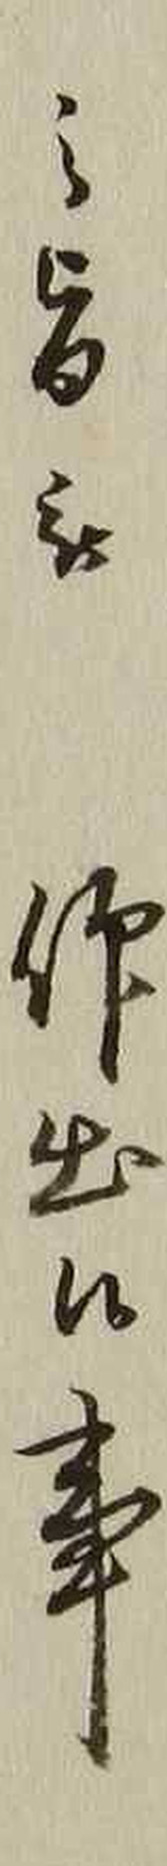之旨被仰出候事
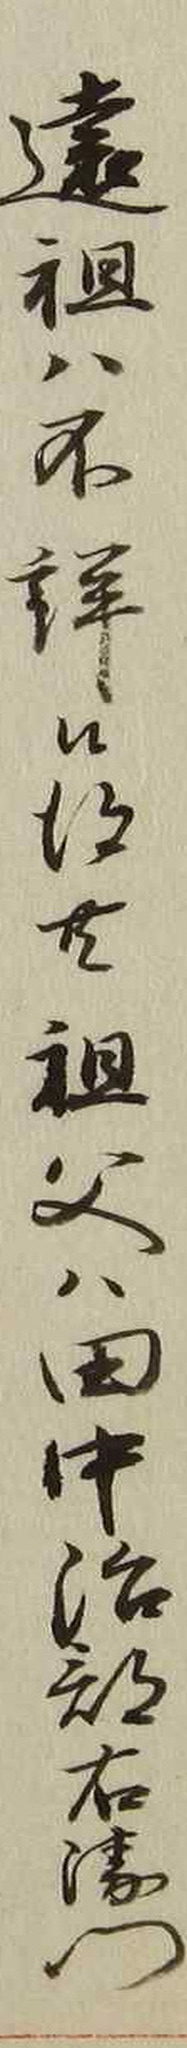遠祖は不詳候得共祖父は田中治部右衛門
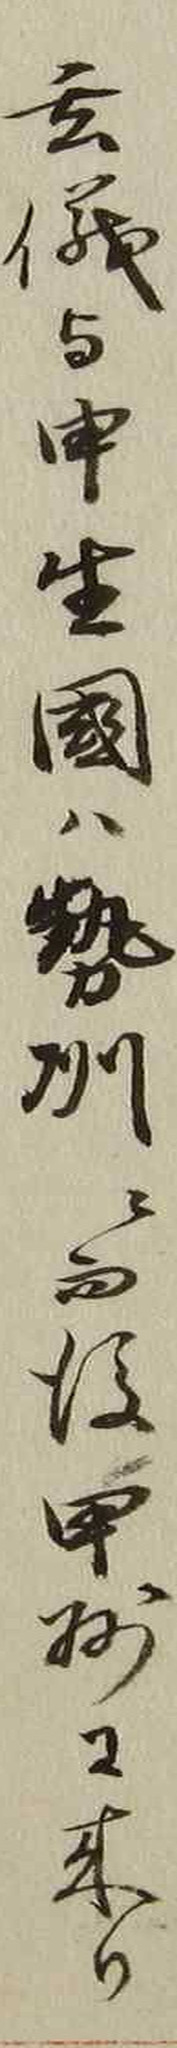玄儀と申生国は勢州に而後甲州に来り
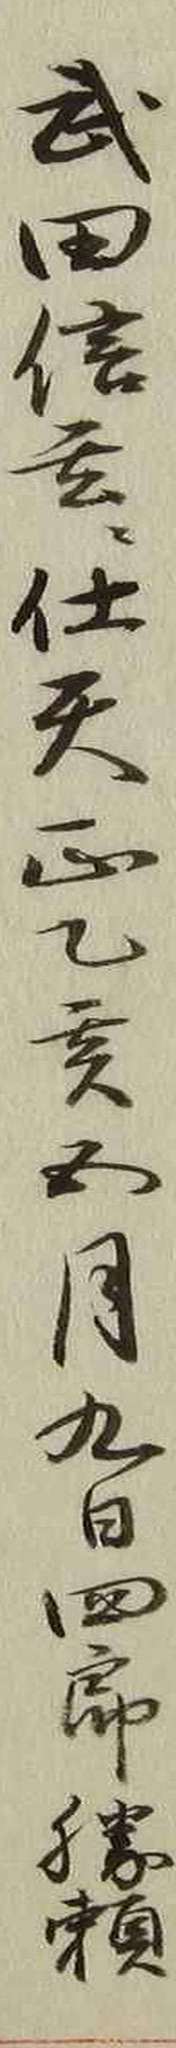武田信玄に仕天正乙亥五月九日四郎勝頼
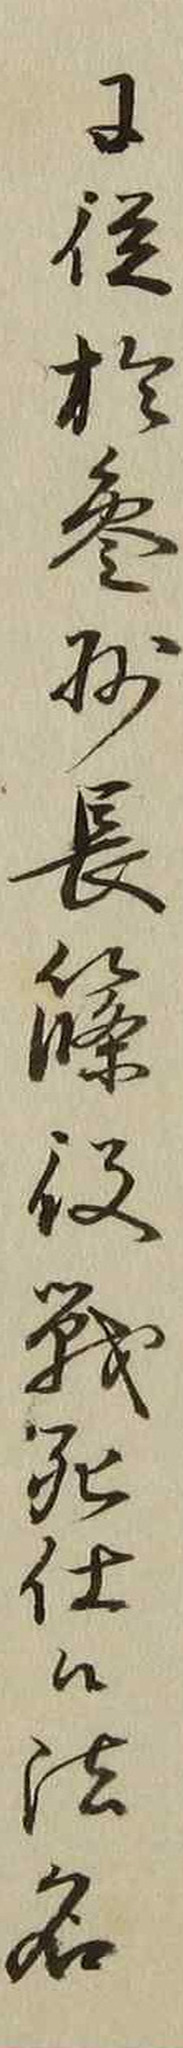に従於参州長篠役戦死仕候法名
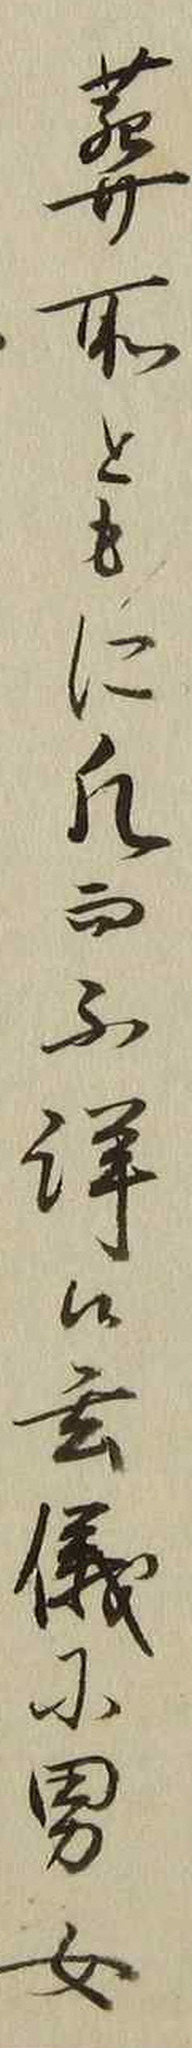葬所ともに凡而不詳候玄儀に男女
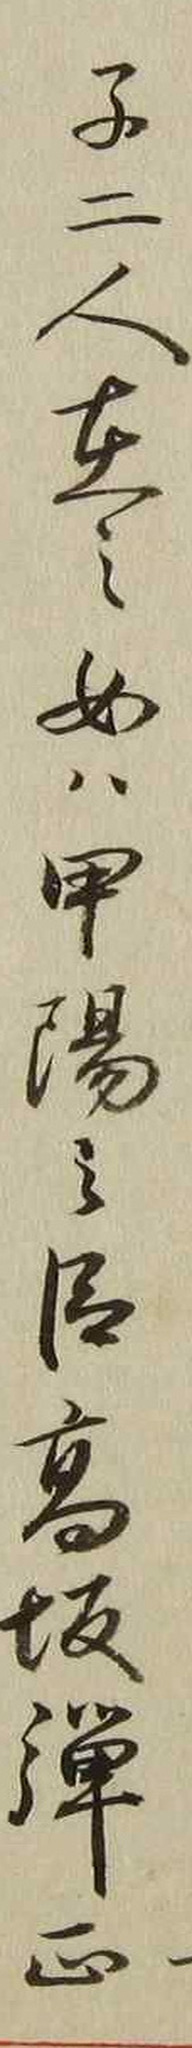子二人在之女は甲陽之臣高坂弾正
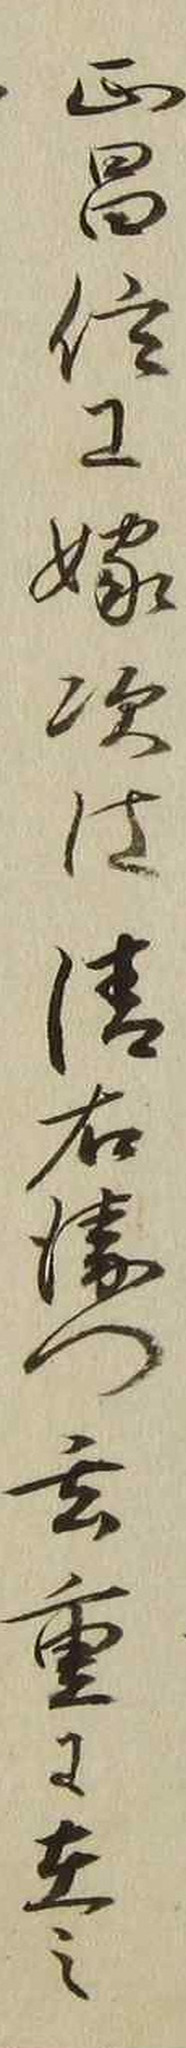正昌信に嫁次は清右衛門玄重に在之
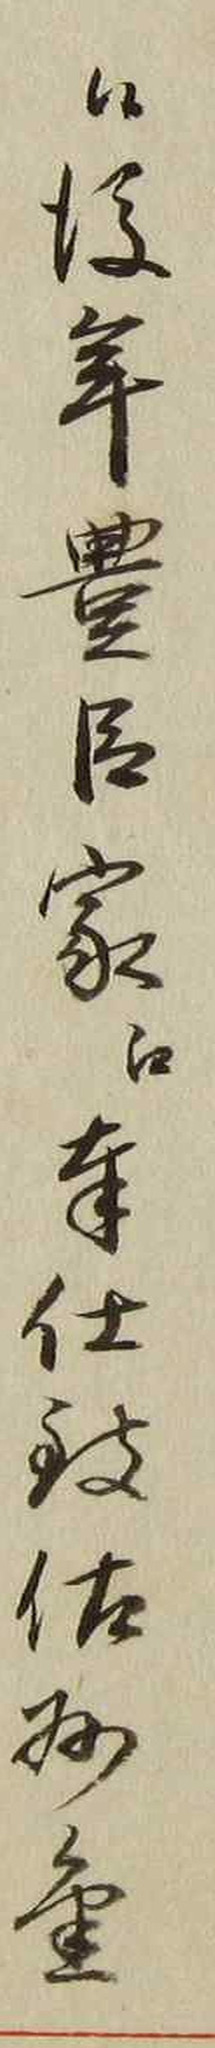候後年豊臣家江奉仕致佐州金
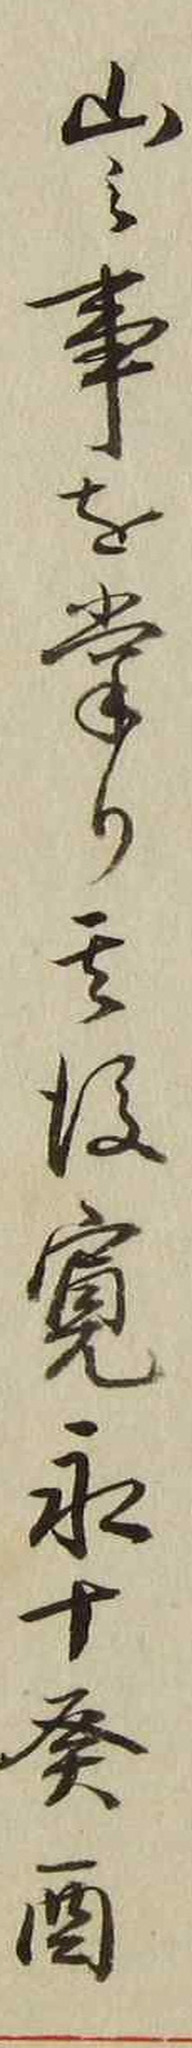山之事を掌り其後寛永十癸酉
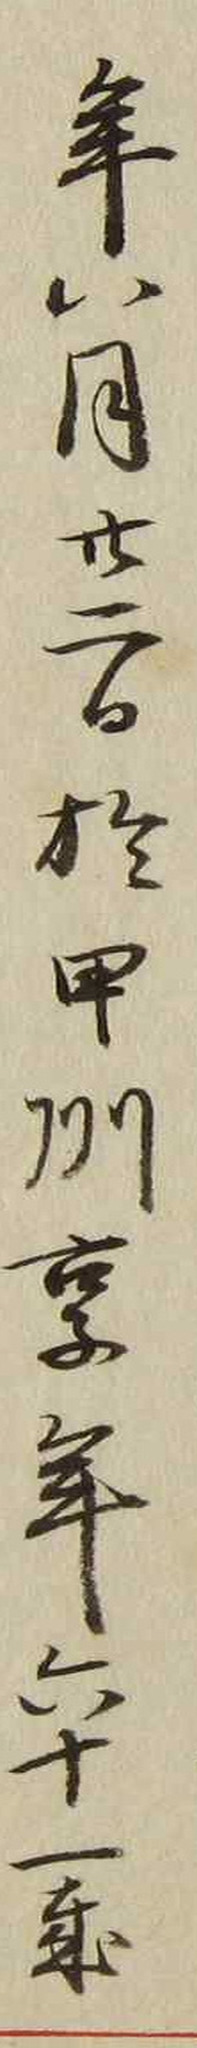年八月廿二日於甲州享年六十一歳
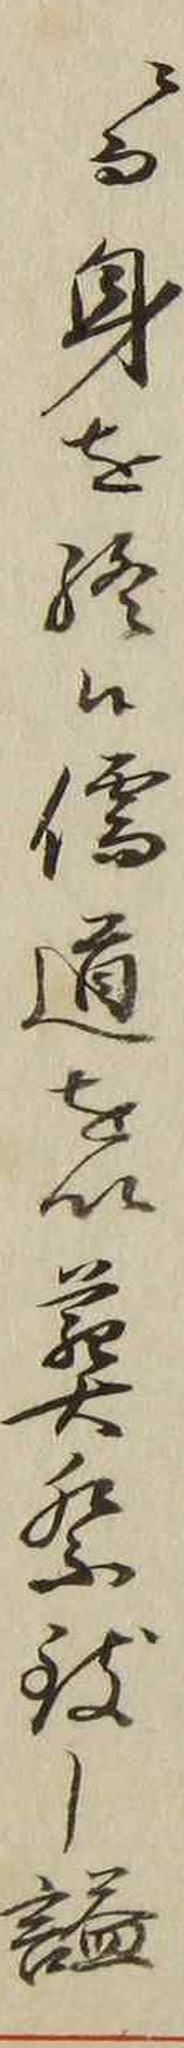に而身を終候儒道を以葬祭致し謚
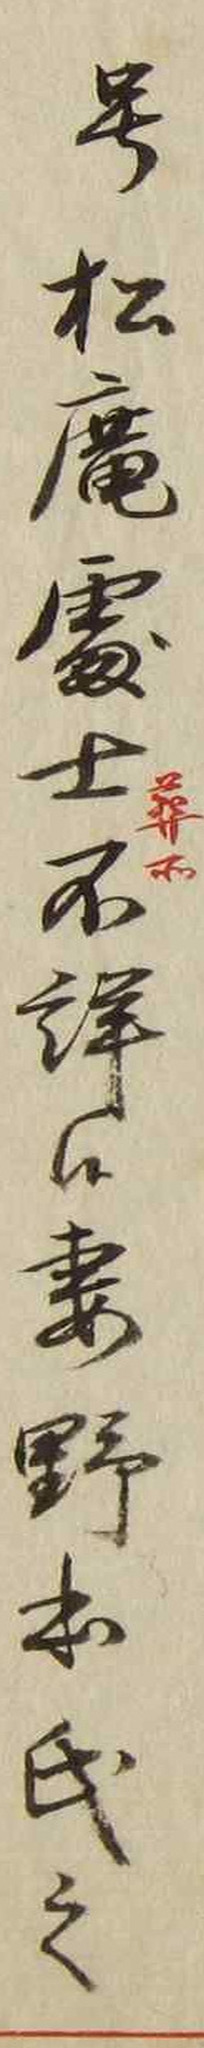号松庵処士葬所不詳候妻野本氏之

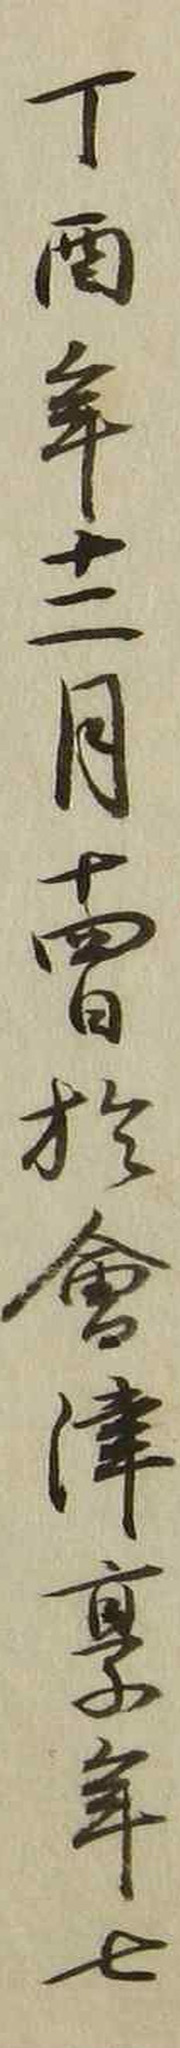丁酉年十二月十四日於会津享年七
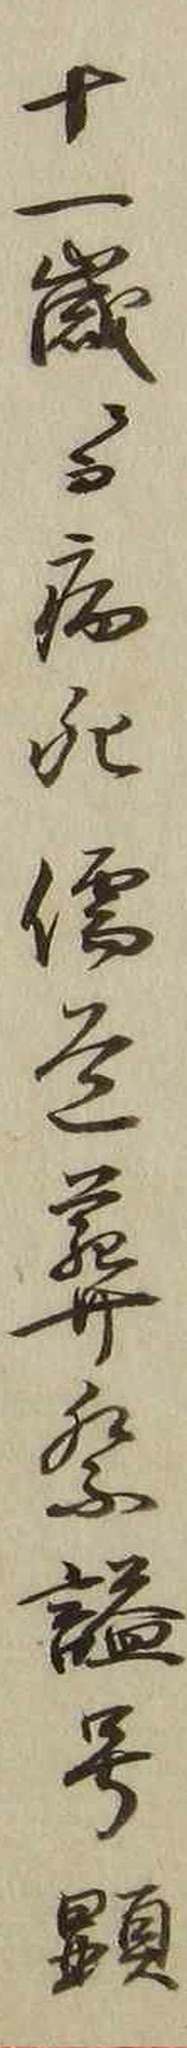十一歳に而病死儒道葬祭諡号顕
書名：諸士系譜　巻之125　た之部1
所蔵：会津若松市立会津図書館
